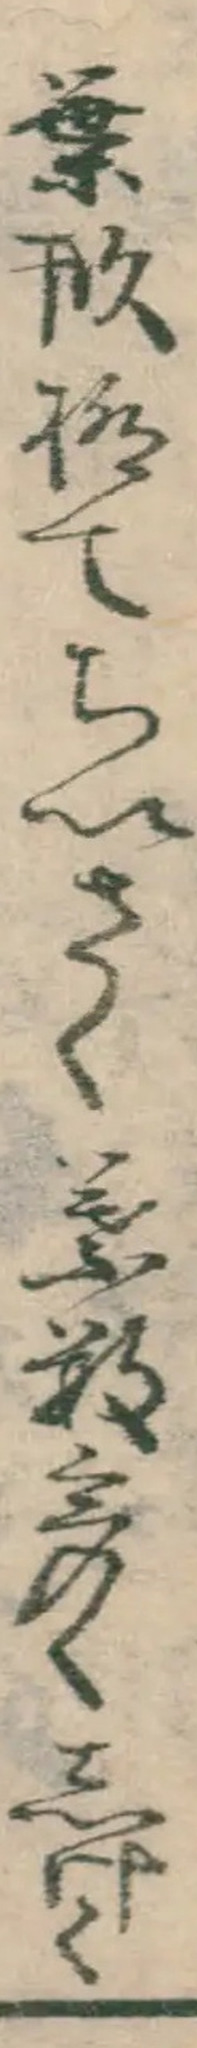葛城葉形極てちいさく葉数多く志けく
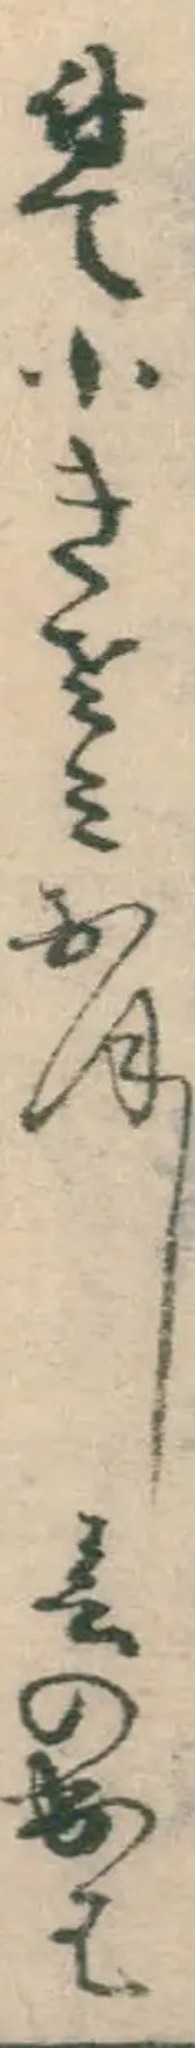付て小きさみおほし春の出は
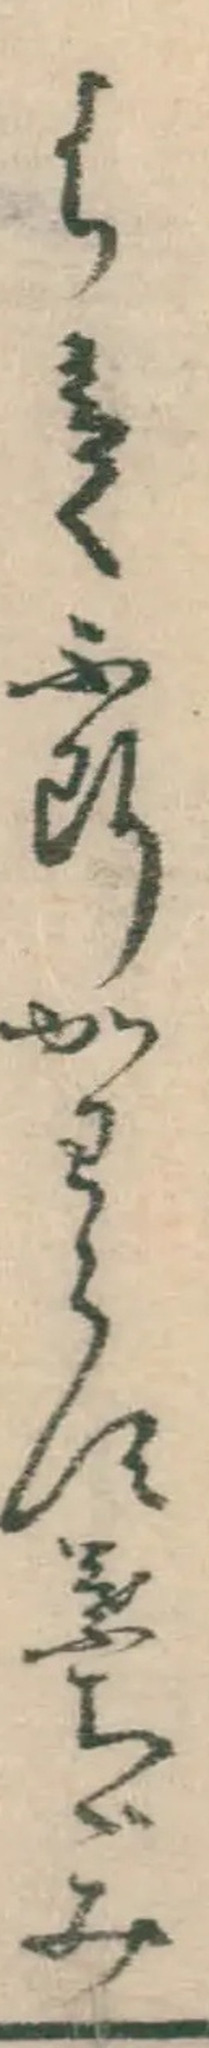より青く不断かわらす葉ちゞみ
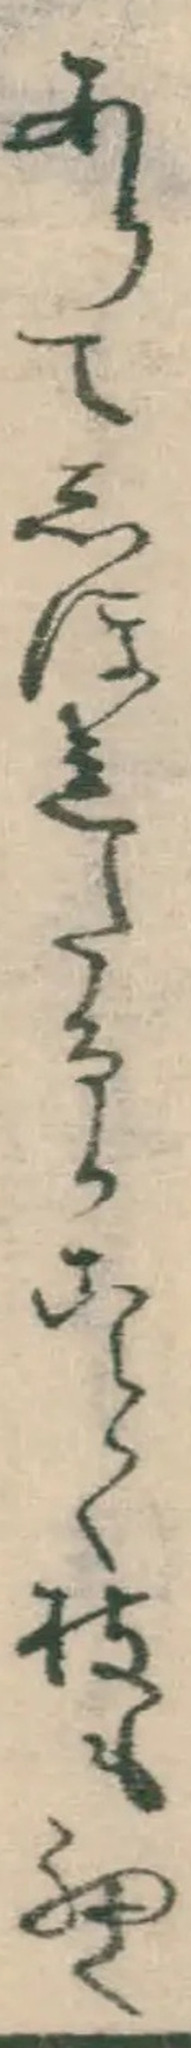ありてしほれたるかことく枝も細く
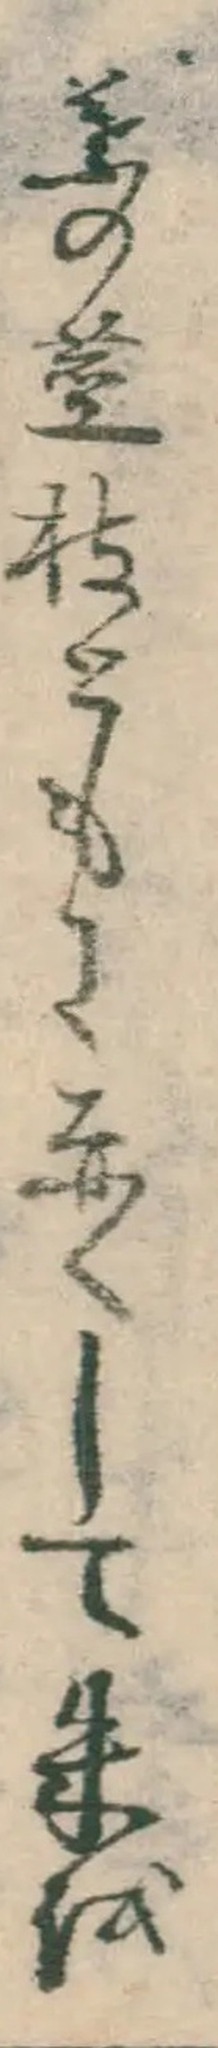葉の茎枝ともに赤くして朱を
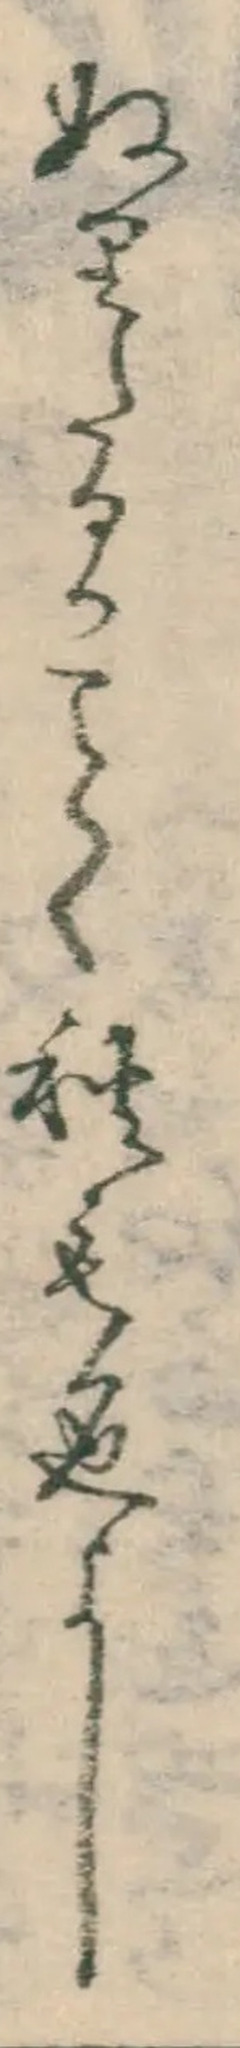ぬりたるかことく秋も色よし
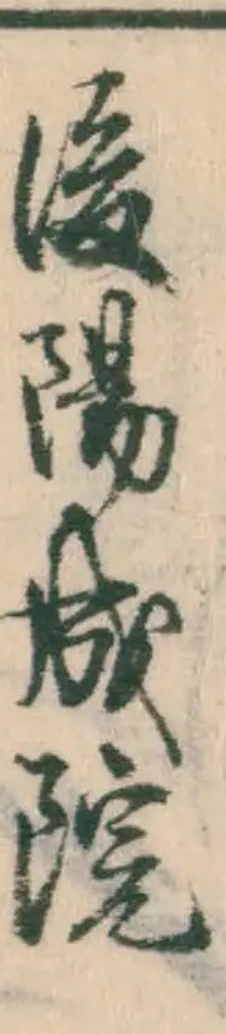後陽成院
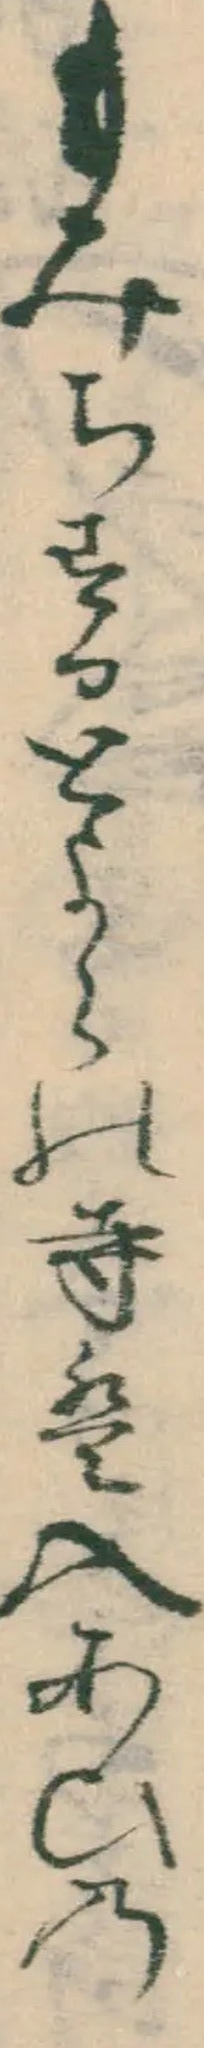もみちするとよらの寺は入あひの
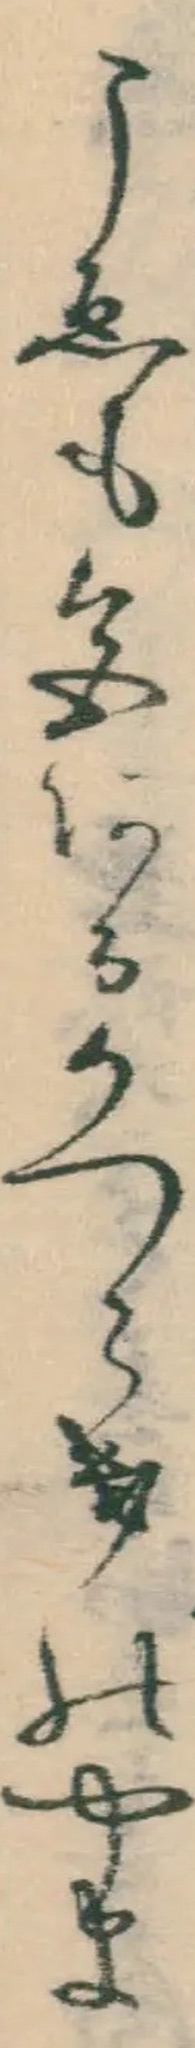こゑも色あるかつらきのやま
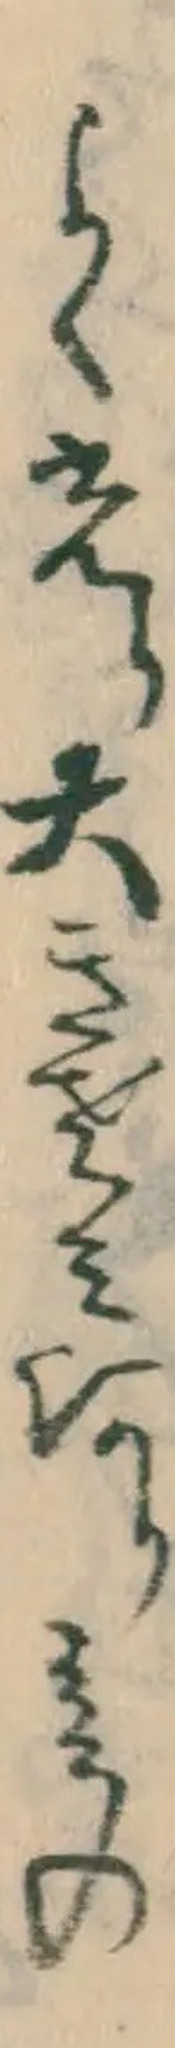よく光り大きさみあり春の
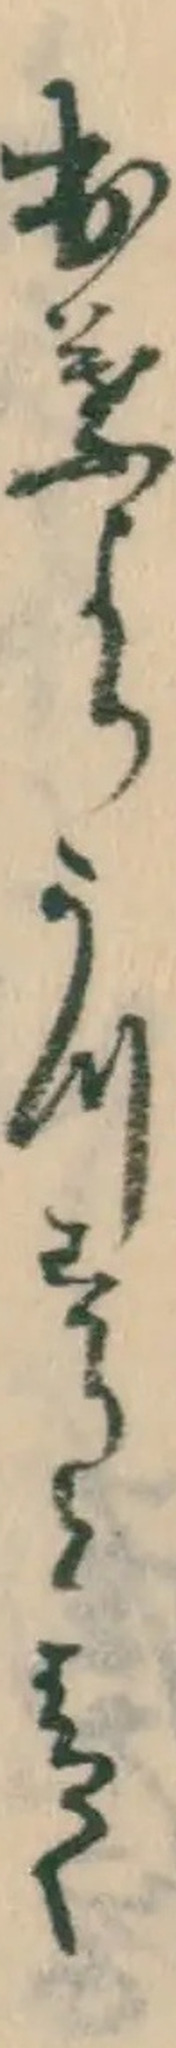出葉よりうつすりと青く
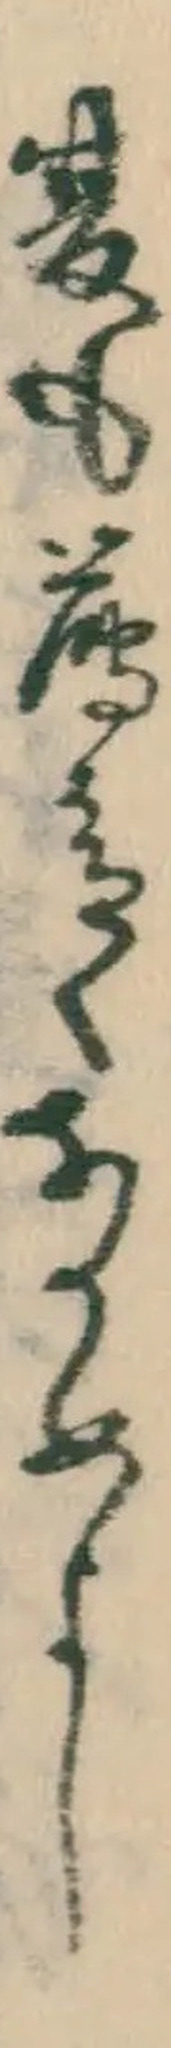夏も薄青くなかめよし
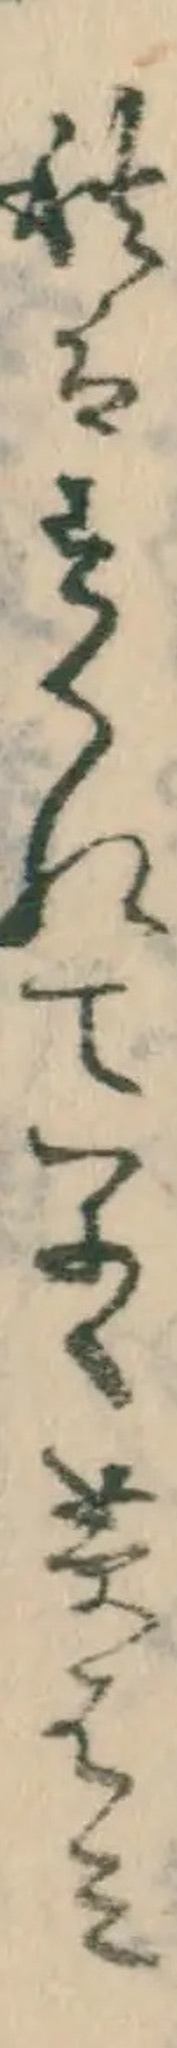秋はすくれて早く黄はみ
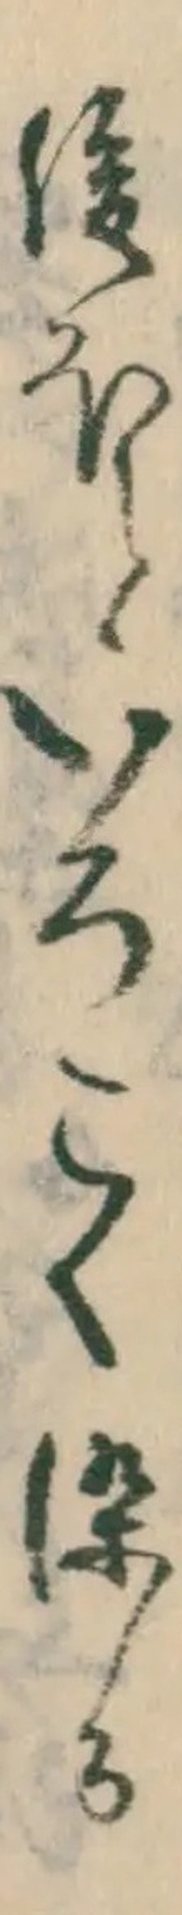後ほといろこく染る
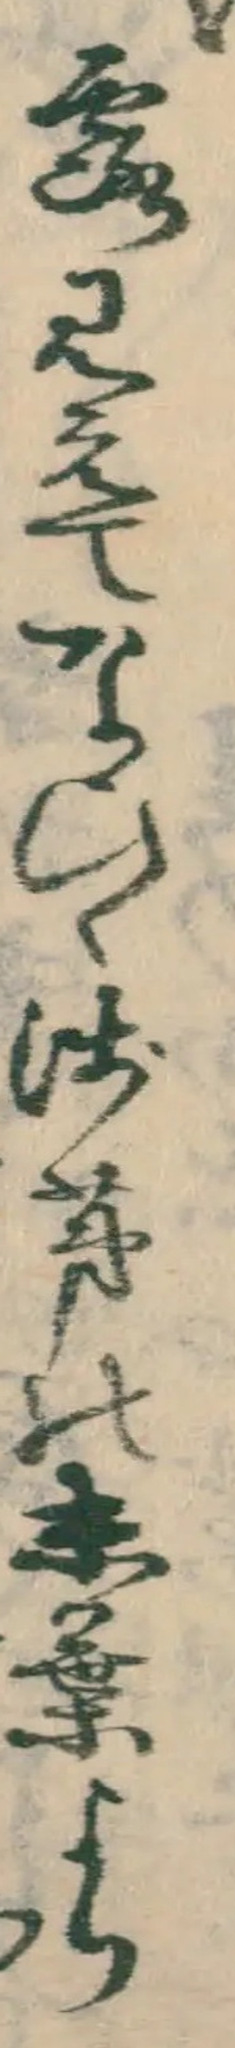露見えてなひく浅茅の末葉より
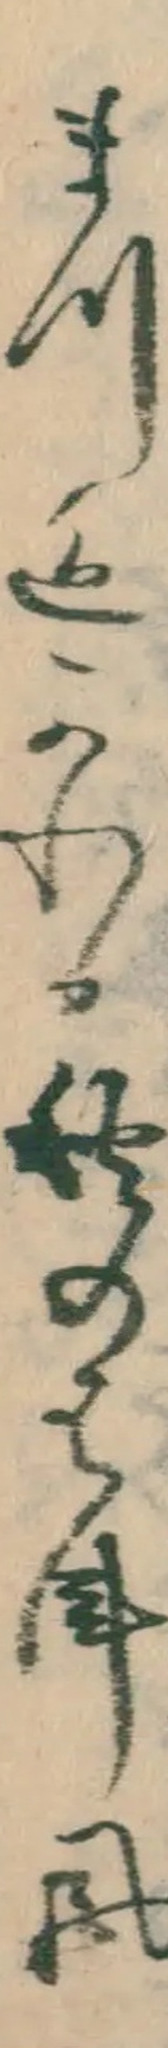まつ色かわる秋のはつ風
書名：紅葉集
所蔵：国立国会図書館 National Diet Library, JAPAN
